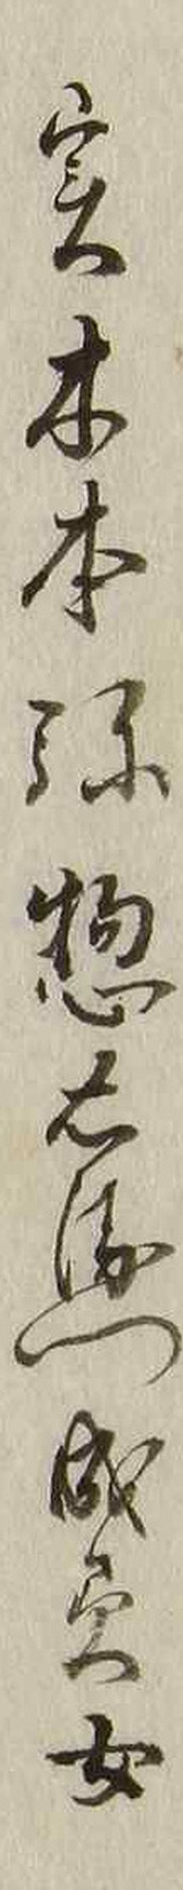実木本弥惣右衛門成美女
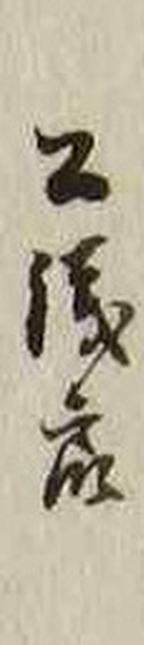公儀衆
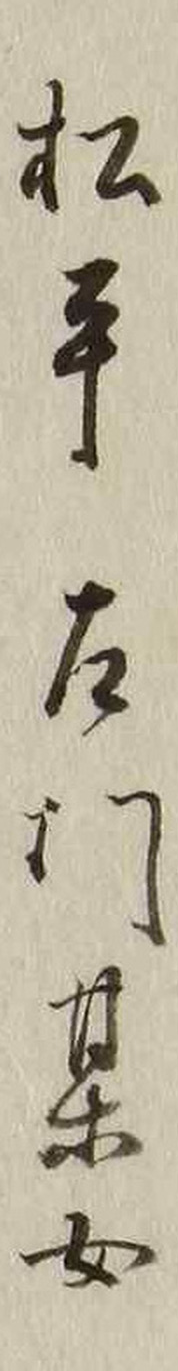松平左門某女同
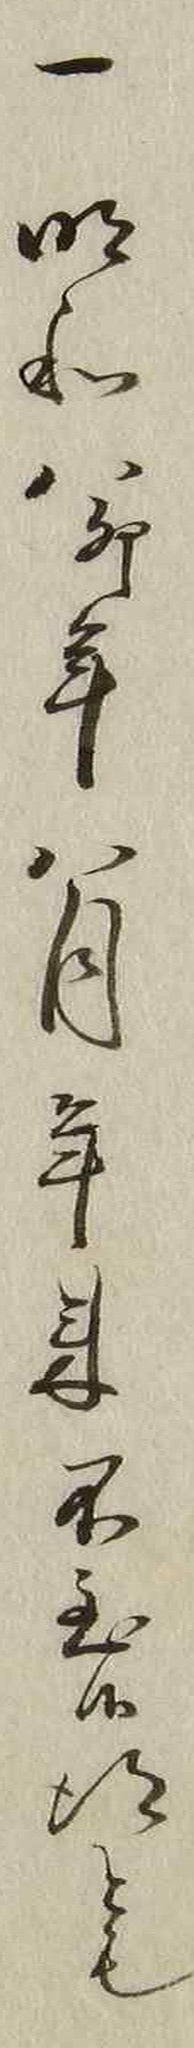一明和八卯年八月年来不至候得とも
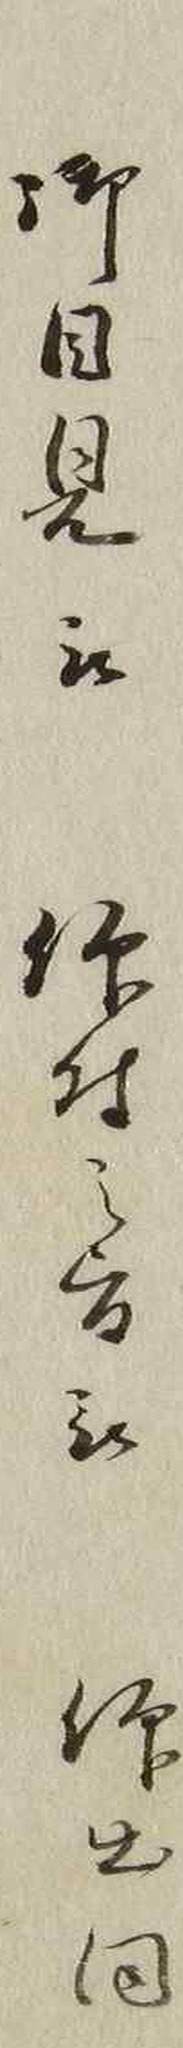御目見被仰付之旨被仰出同
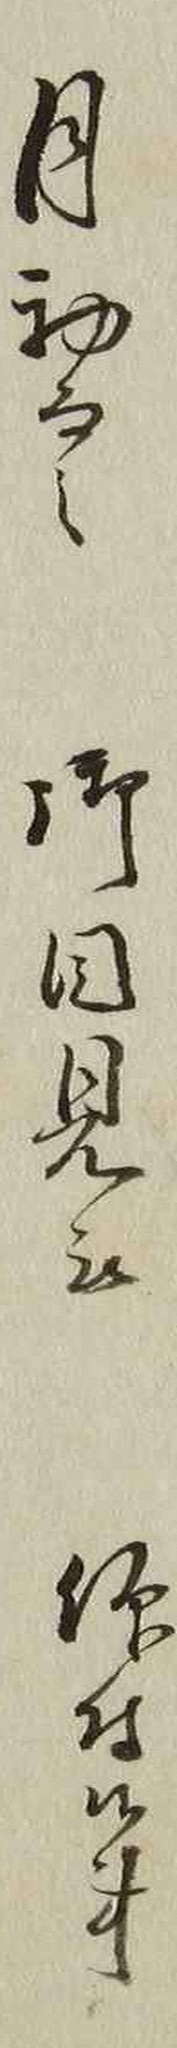月初而之御目見被仰付候事
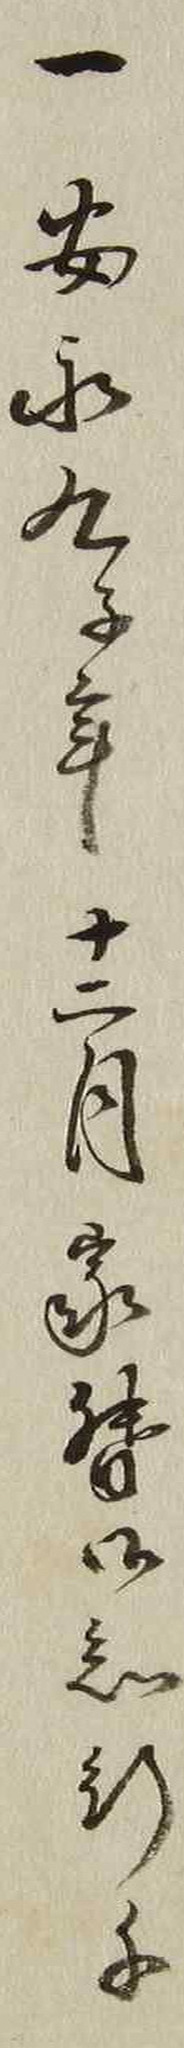一安永九子年十二月家督御知行千
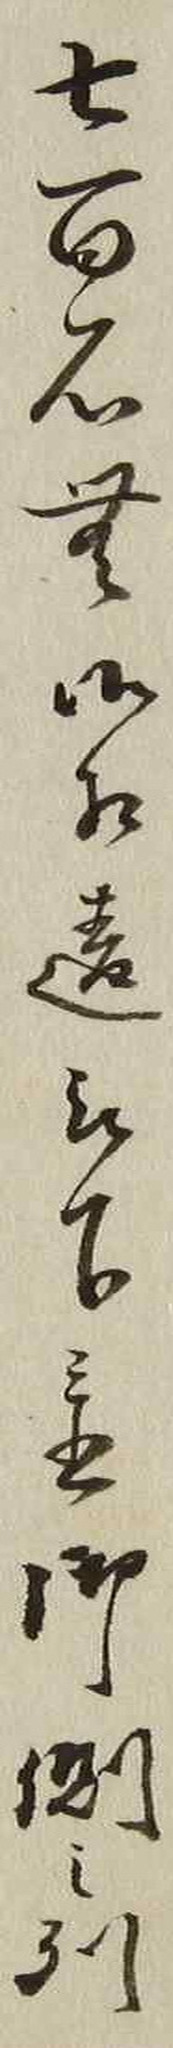七百石無御相違被下置御側之列
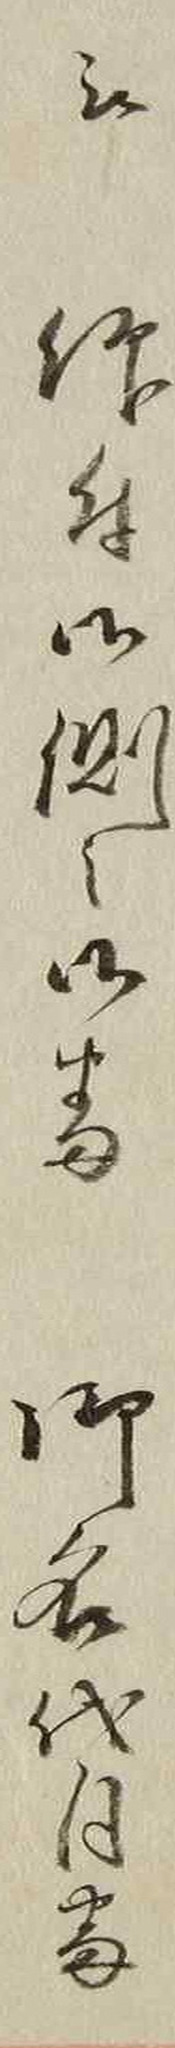被仰付御側之御番御名代月番
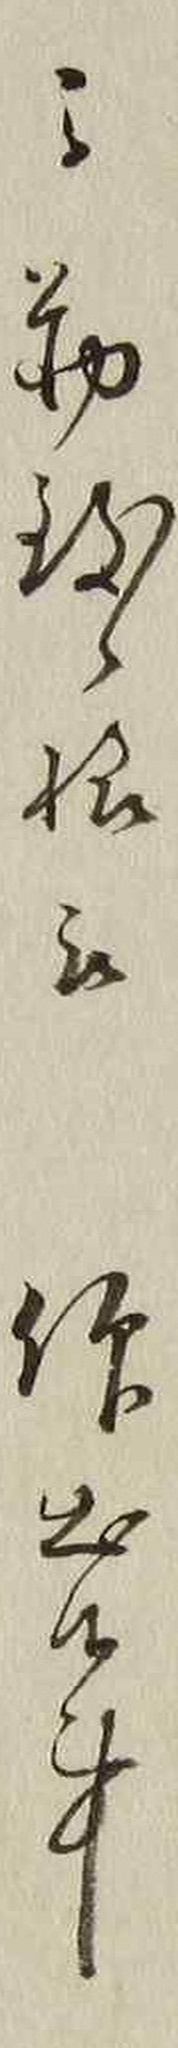之勤致候様被仰出候事
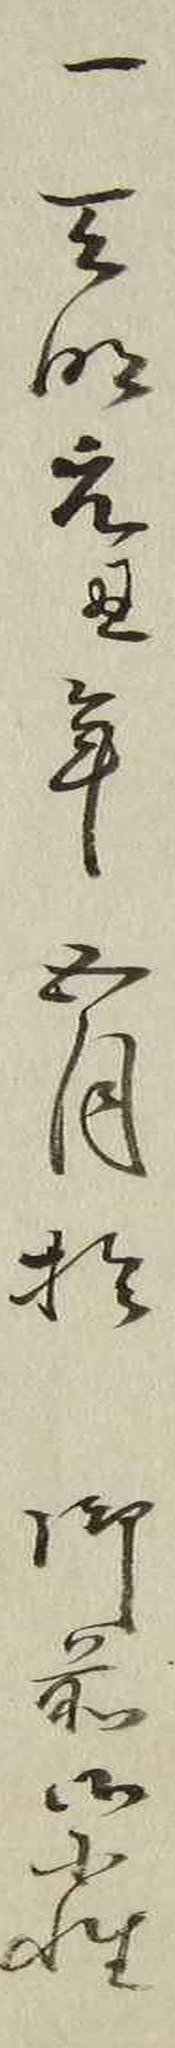一天明元丑年五月於御前御小姓
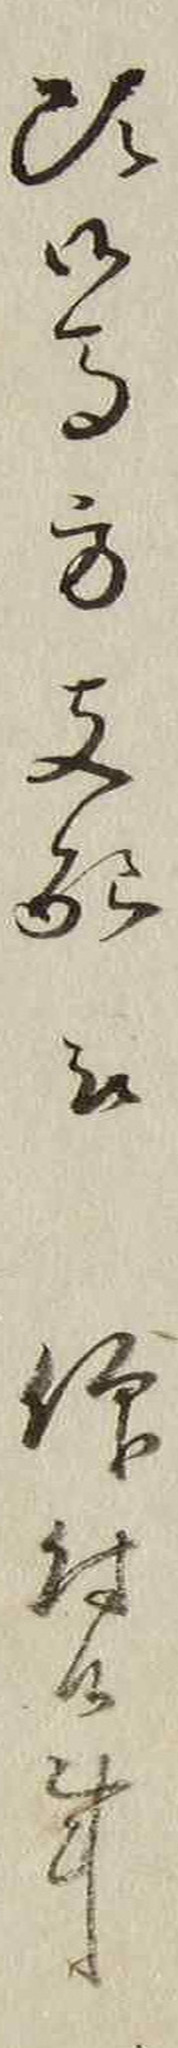頭御馬方支配被仰付候事
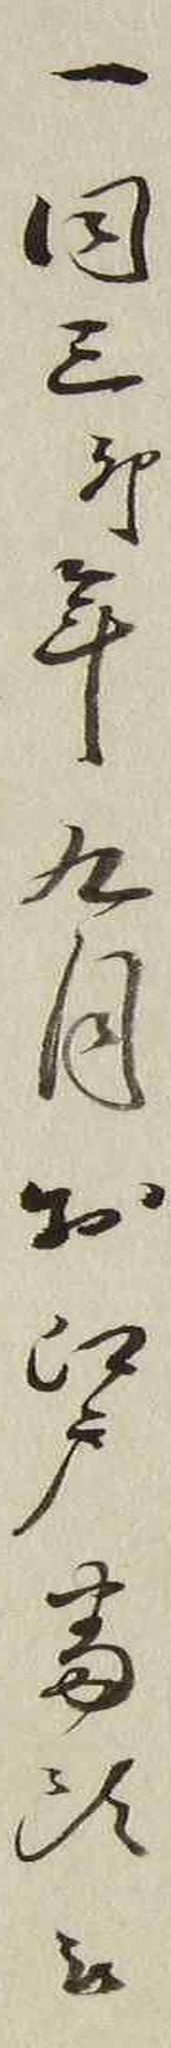一同三卯年九月於江戸番頭被
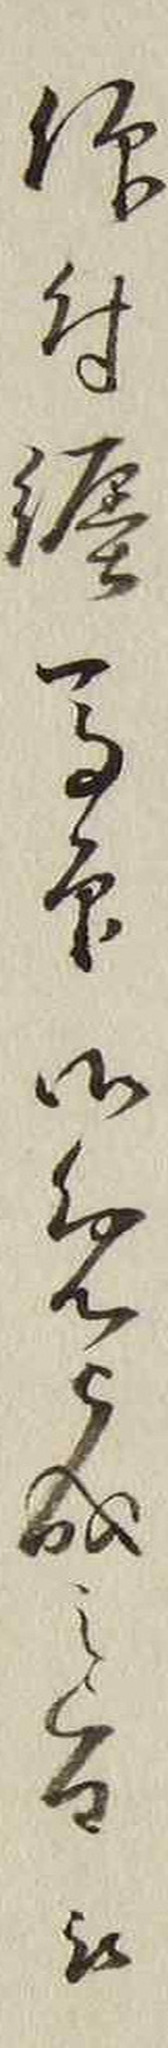仰付纏馬印御免被成候旨被
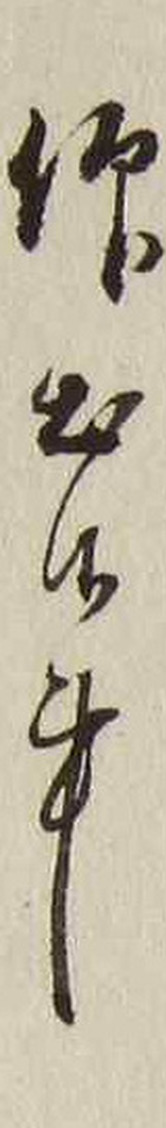仰出候事
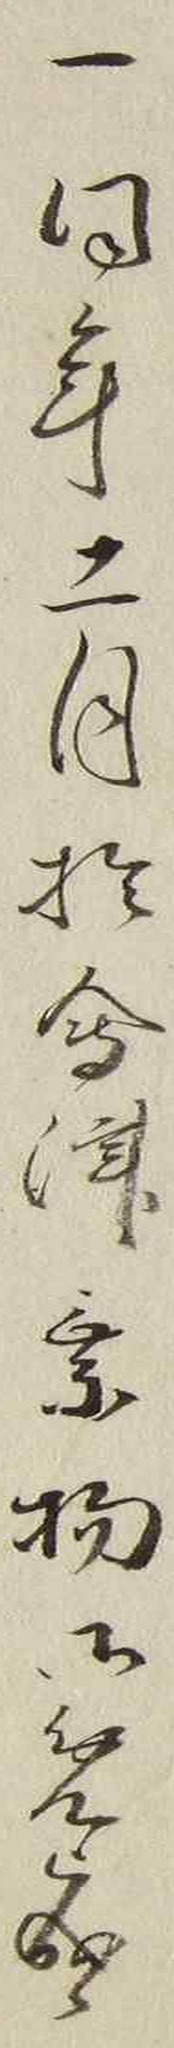一同年十一月於会津乗物御免被成候
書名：諸士系譜　巻之159　な之部1
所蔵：会津若松市立会津図書館
